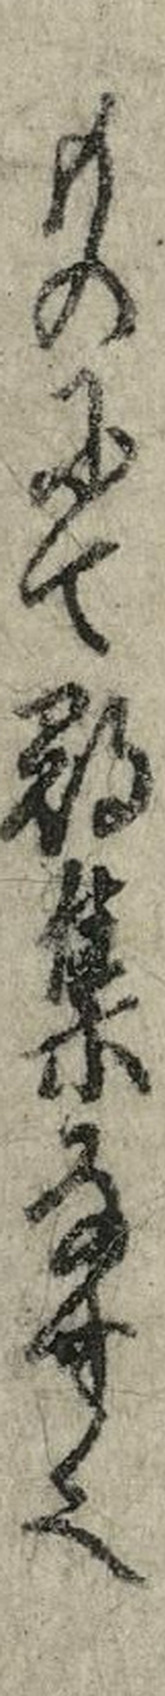ものにて群集なす也

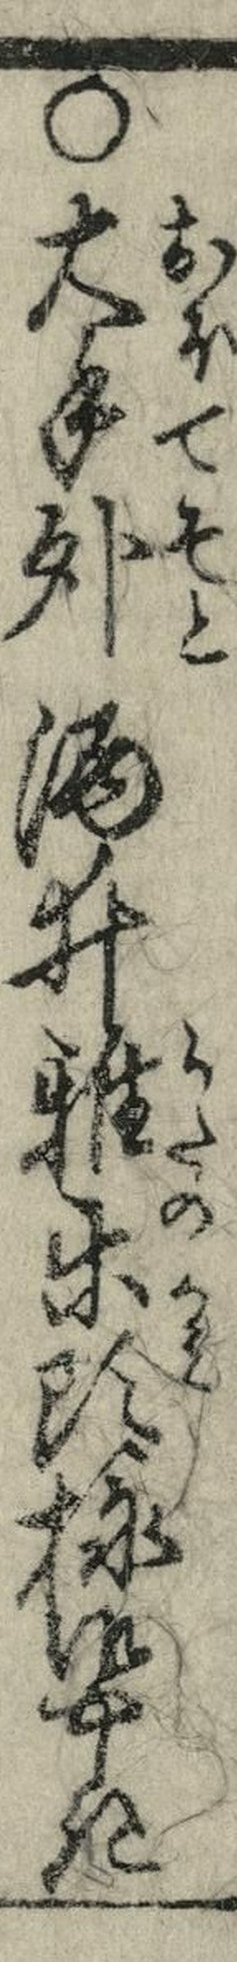○大手外酒井雅楽頭様御やしき
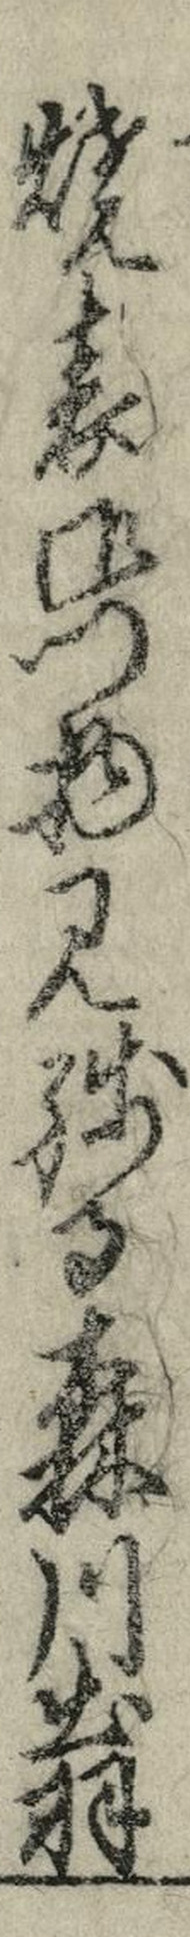焼表御門物見残る森川出羽
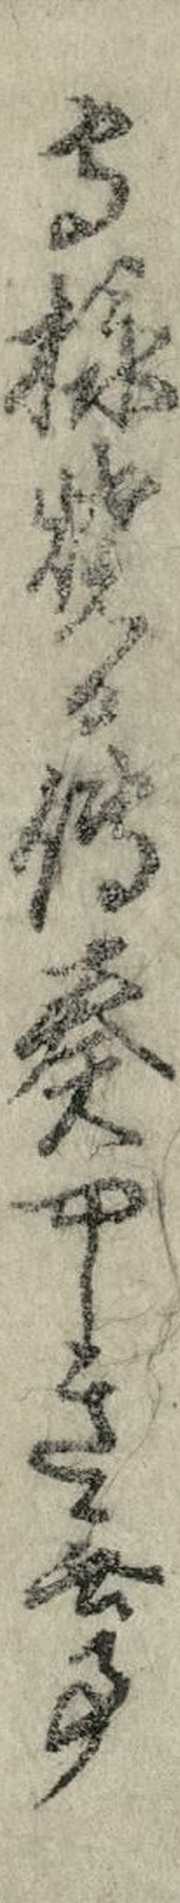守様焼る伝奏やしきに無事
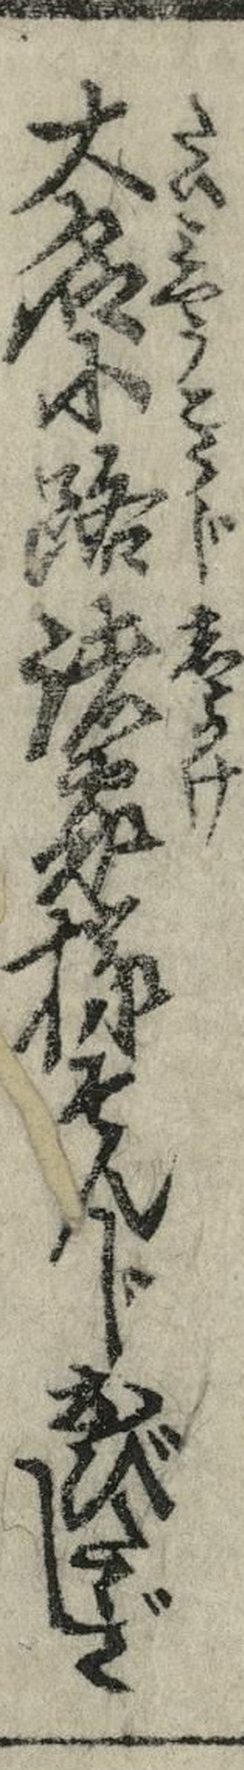大名小路諸家様そんじおびたゞしく
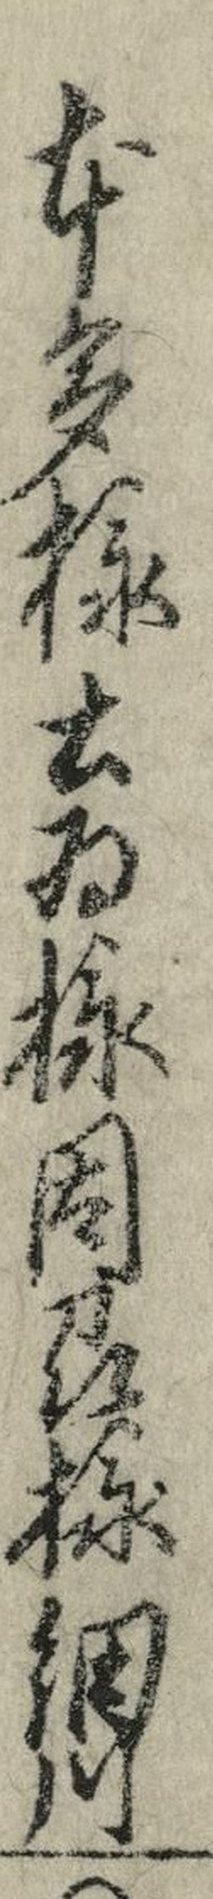本多様土ゐ様因州様細川
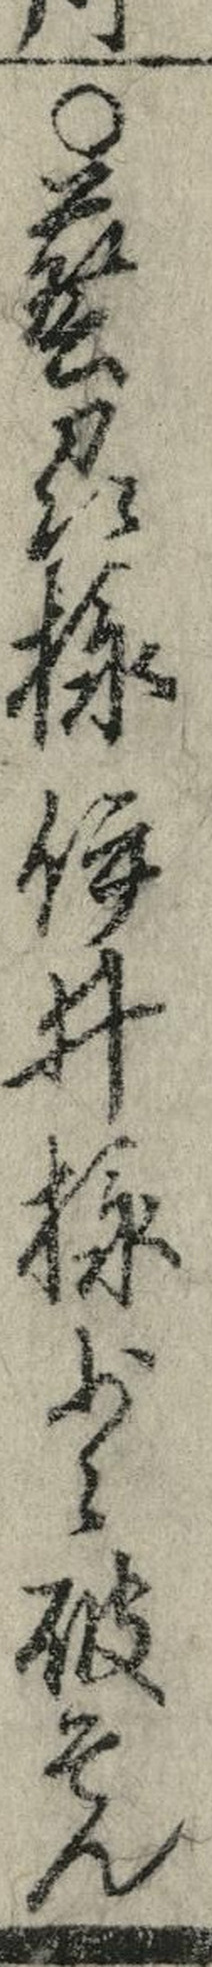○芸州様伊井様少々破そん
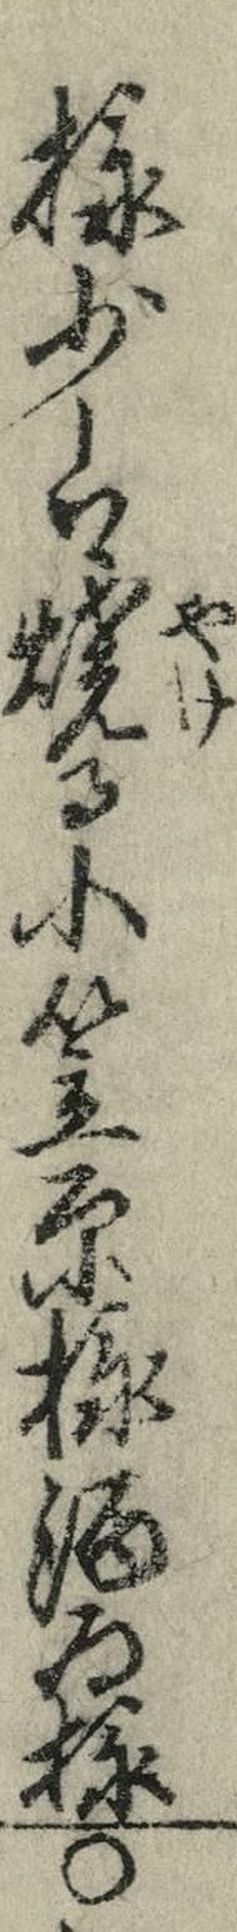様少しつゝ焼る小笠原様酒ゐ様
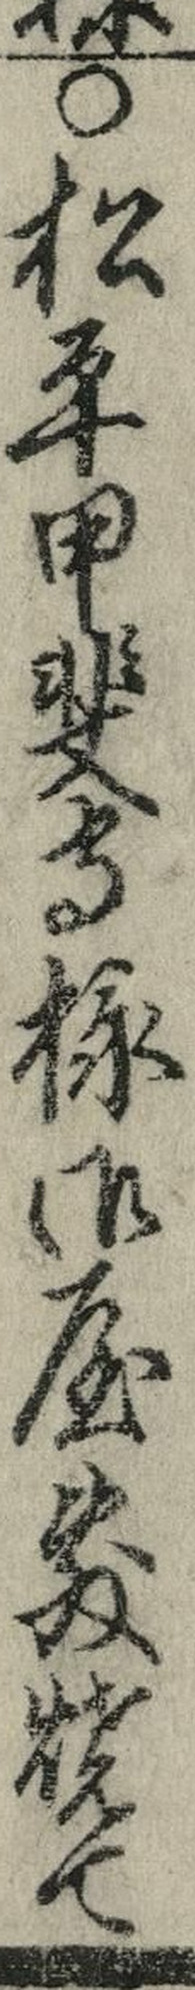○松平甲斐守様御屋敷焼て
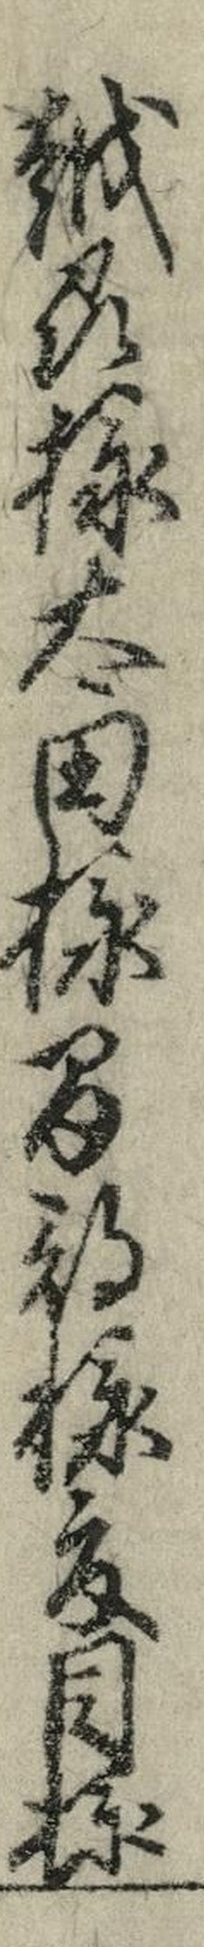越州様太田様間部様夏目様
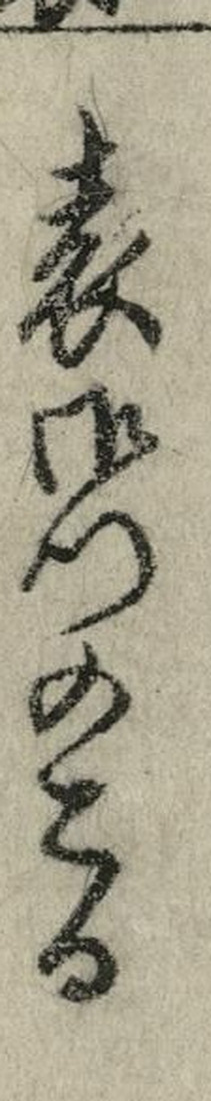表御門のこる
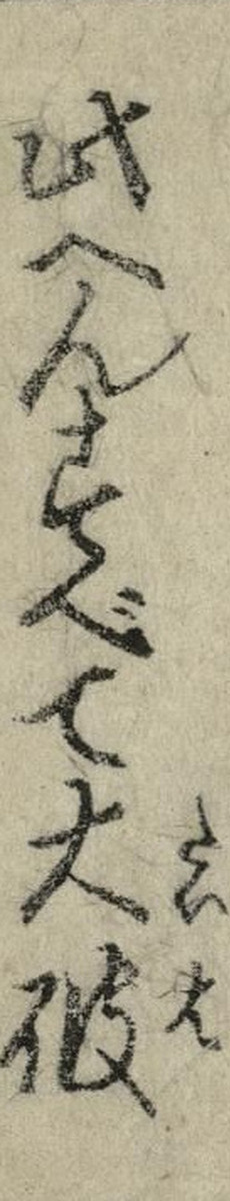此へんすべて大破
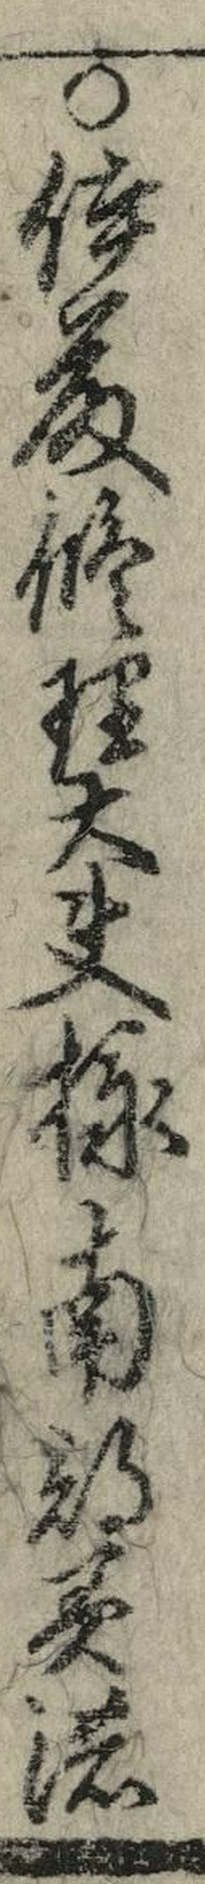○伊藤修理大夫様南部美濃
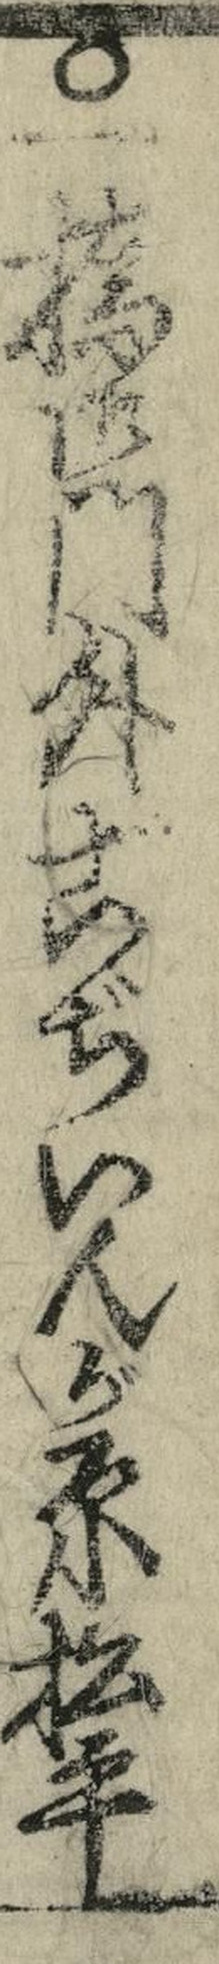○一橋御門外ごぢいんが原松平
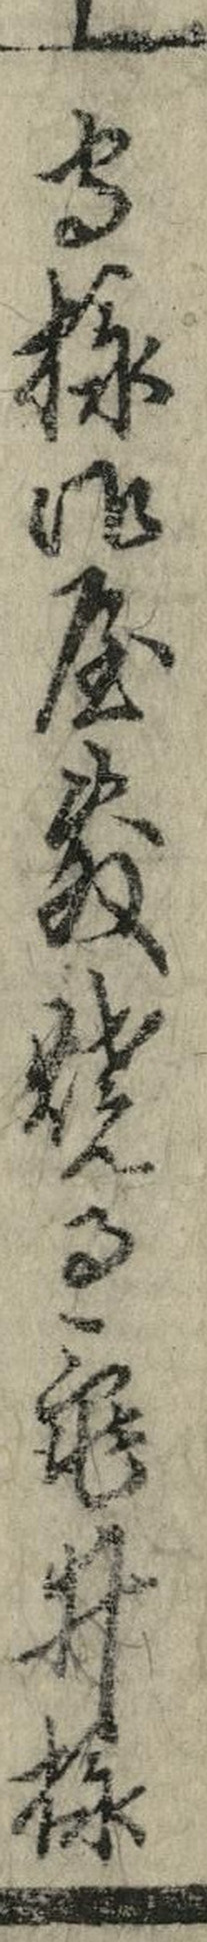守様御屋敷焼る亀井様
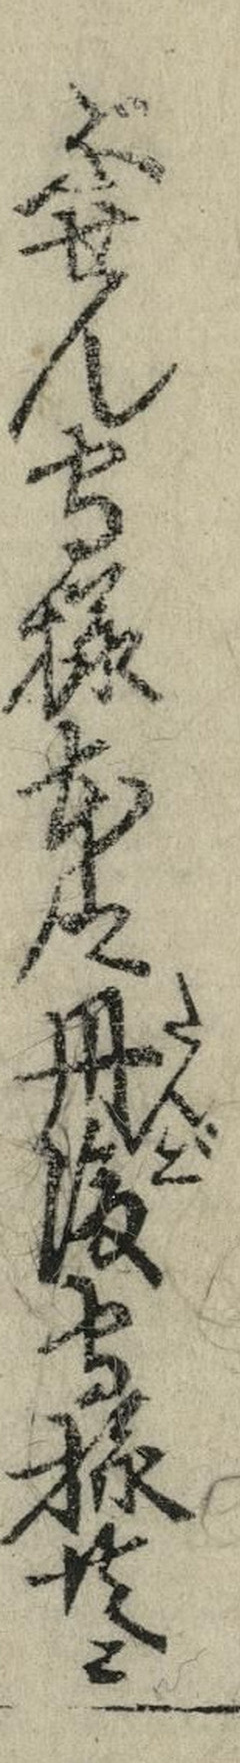ぶぜん守様本郷丹後守様共ニ
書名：江戸　大地震末代噺の種　全
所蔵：東京大学地震研究所図書室 Earthquake Research Institute Library, The University of Tokyo, JAPAN
